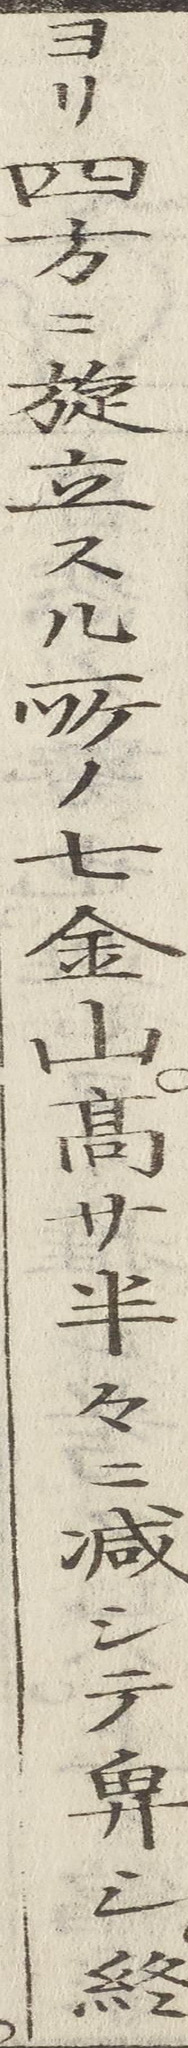ヨリ四方ニ旋立スル所ノ七金山。高サ半々ニ減シテ卑シ。終
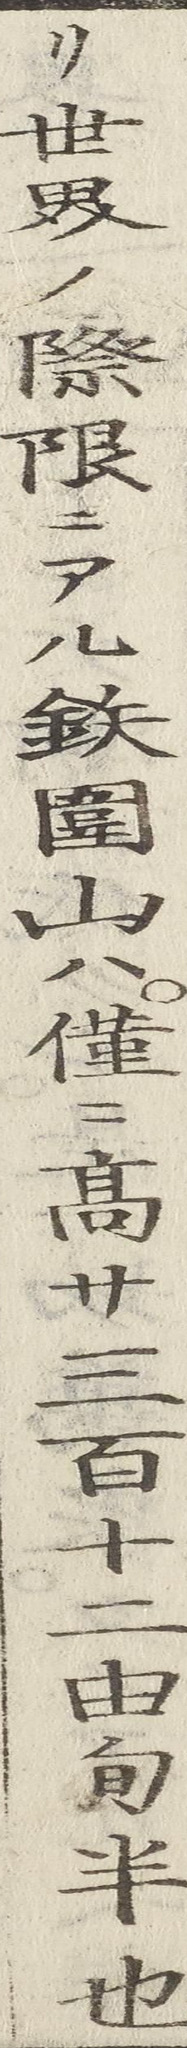リ世界ノ際限ニアル鉄囲山ハ。僅ニ高サ三百十二由旬半也。
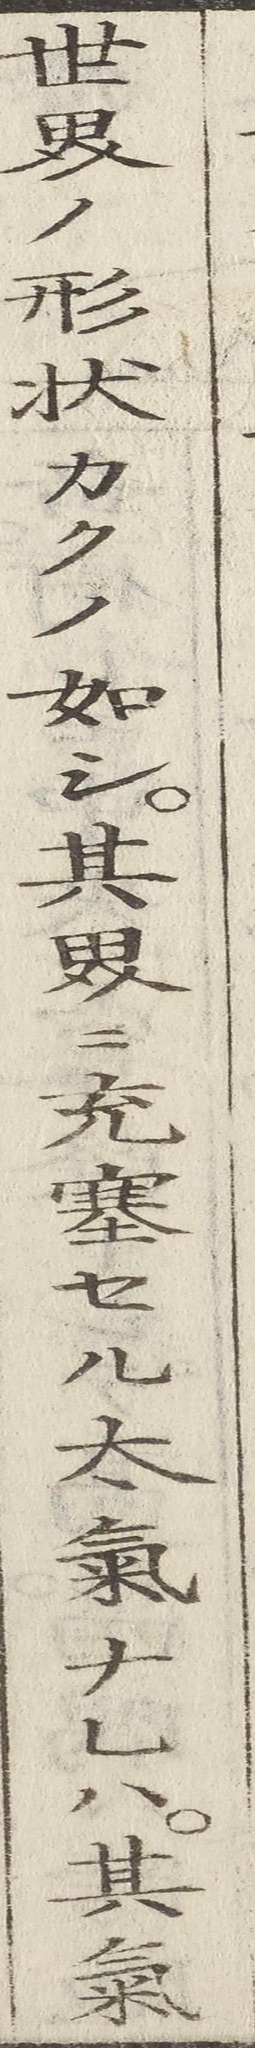世界ノ形状カクノ如シ。其界ニ充塞セル太気ナレハ。其気
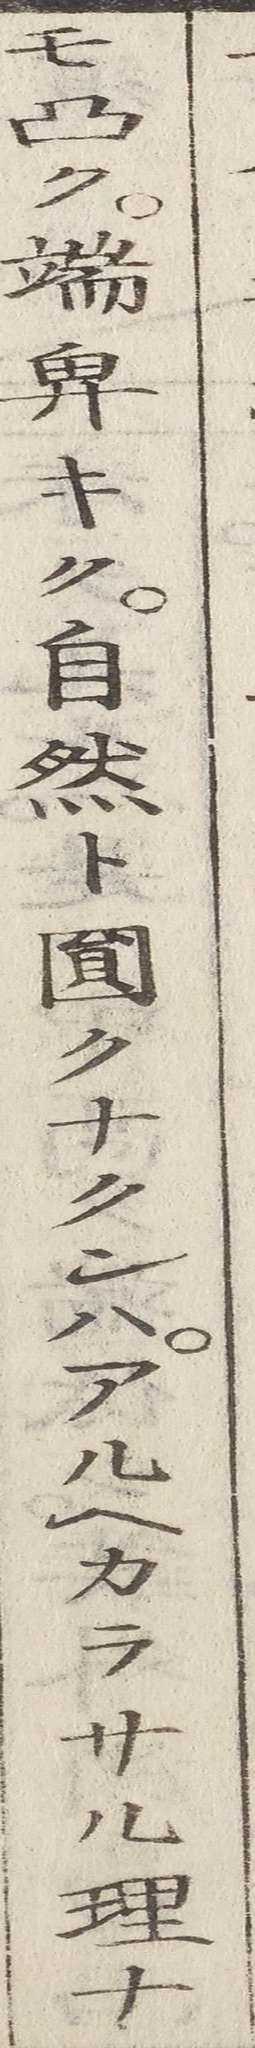モ凸ク。端卑キク。自然ト円クナクンハ。アルヘカラサル理ナ
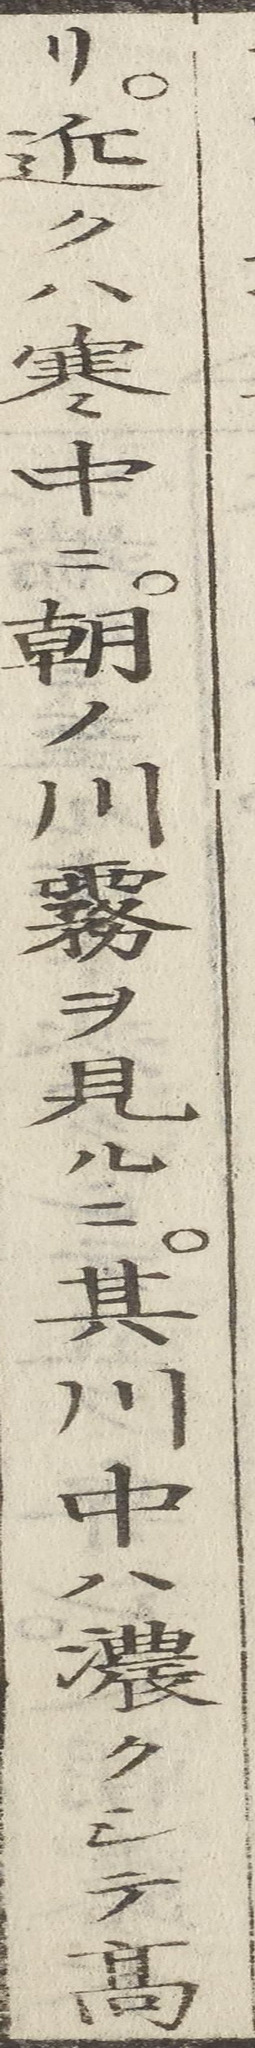リ。近クハ寒中ニ。朝ノ川霧ヲ見ルニ。其川中ハ濃クシテ高

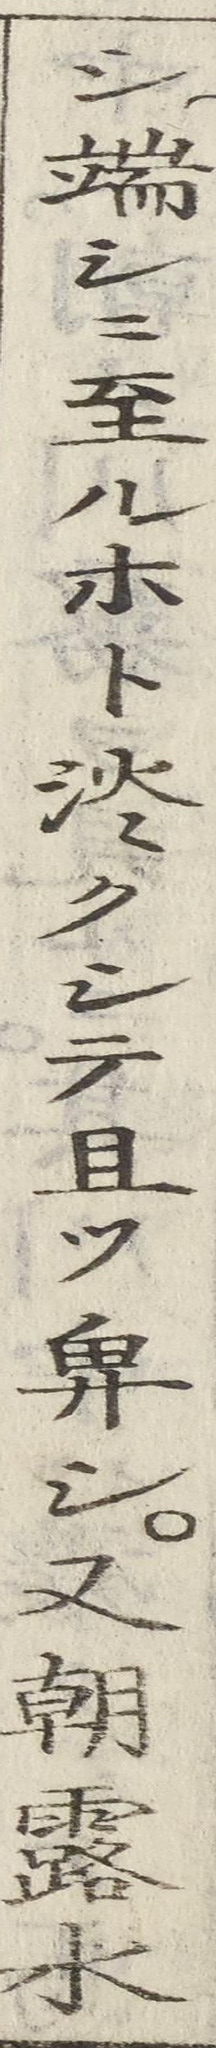シ。端シニ至ルホト淡クシテ且ツ卑シ。又朝露水
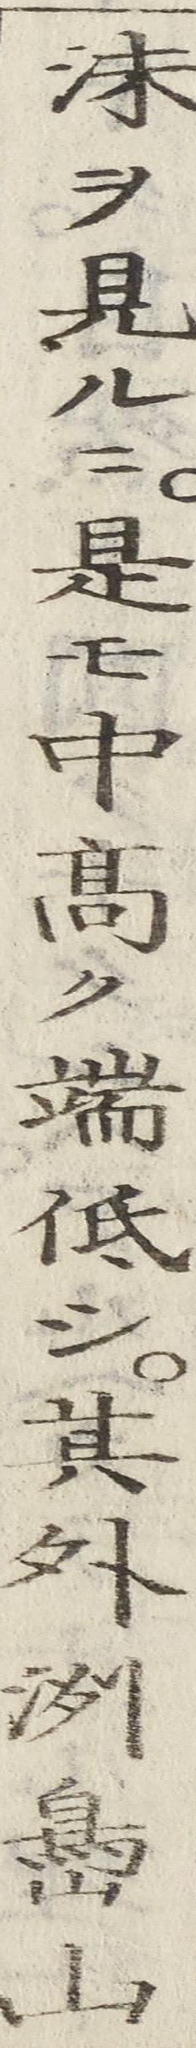沫ヲ見ルニ。是モ中高ク端低シ。其外洌嶋山
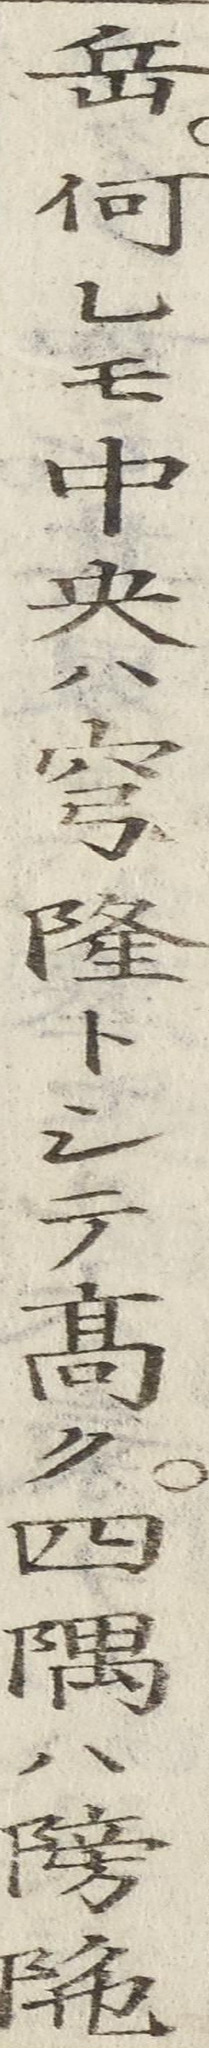岳。何レモ中央ハ穹隆トシテ高ク。四隅ハ䧛陁
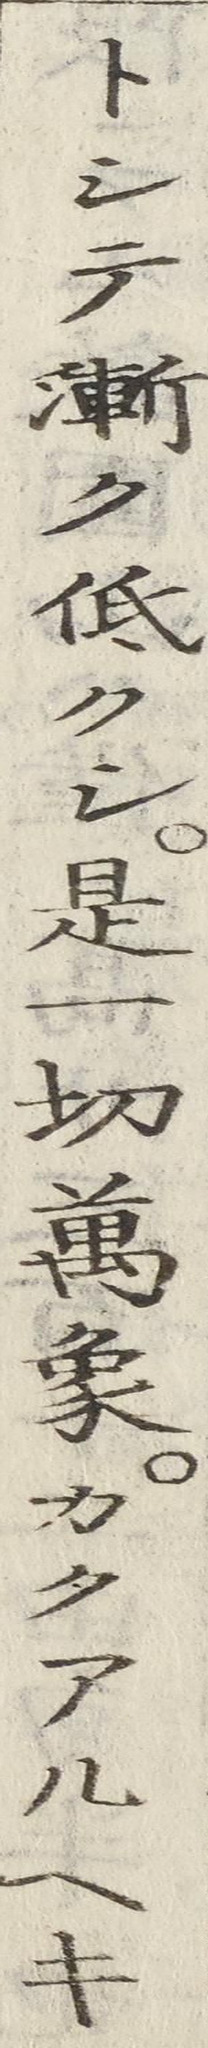トシテ漸ク低クシ。是一切万象。カクアルヘキ
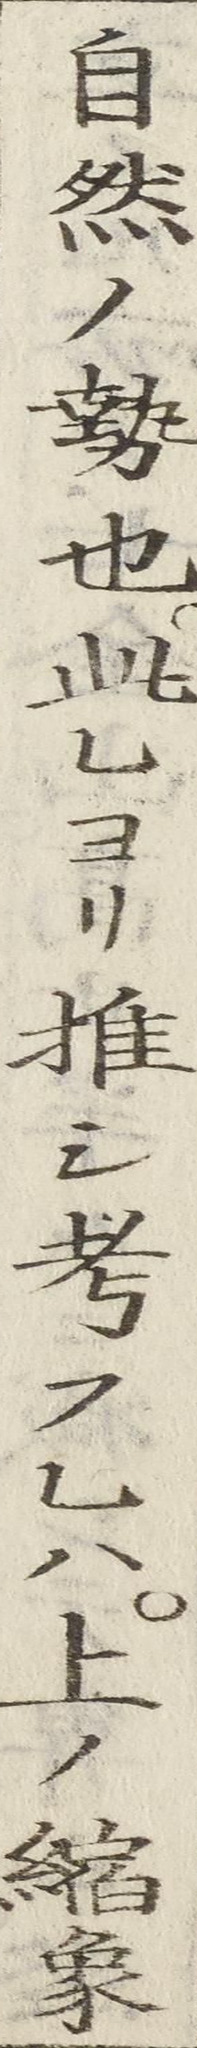自然ノ勢也。此レヨリ推シ考フレハ。上ノ縮象
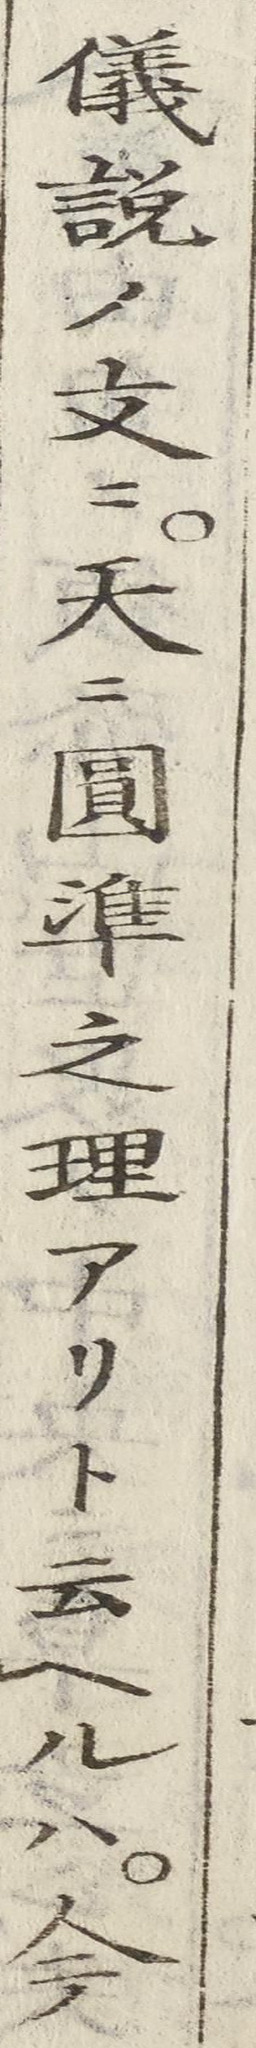儀説ノ文ニ。天ニ円準之理アリト云ヘルハ。今
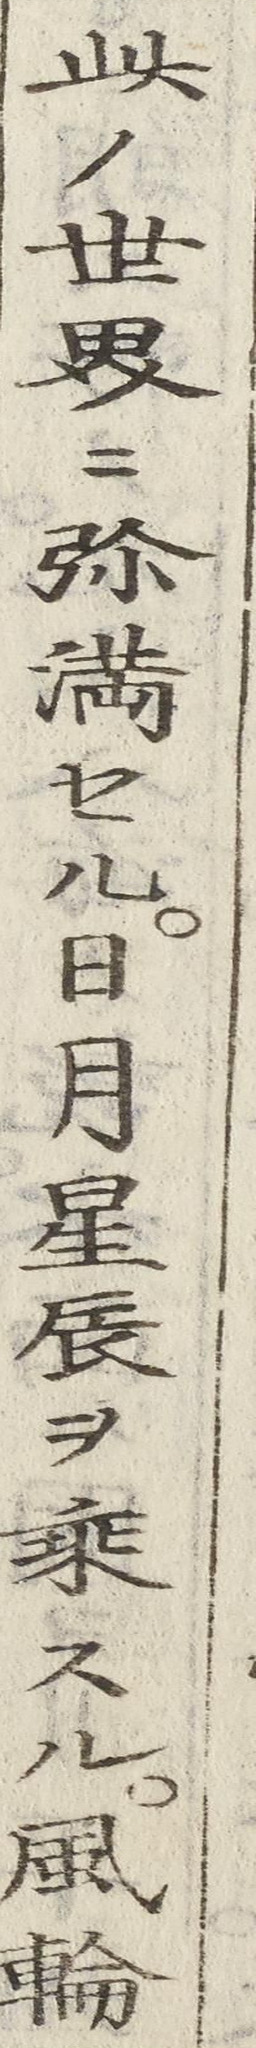此ノ世界ニ弥満セル。日月星辰ヲ乗スル。風輪
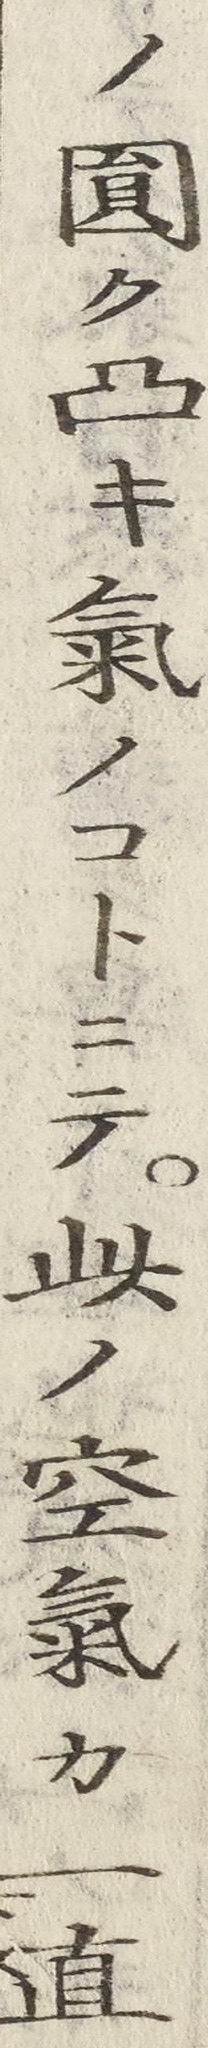ノ円ク凸キ気ノコトニテ。此ノ空気カ一直
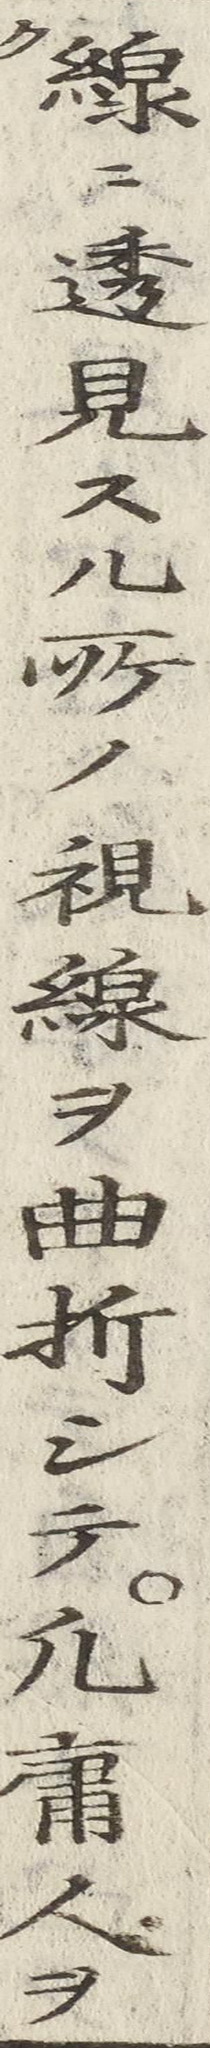線ニ透見スル所ノ視線ヲ曲折シテ。凡庸人ヲ
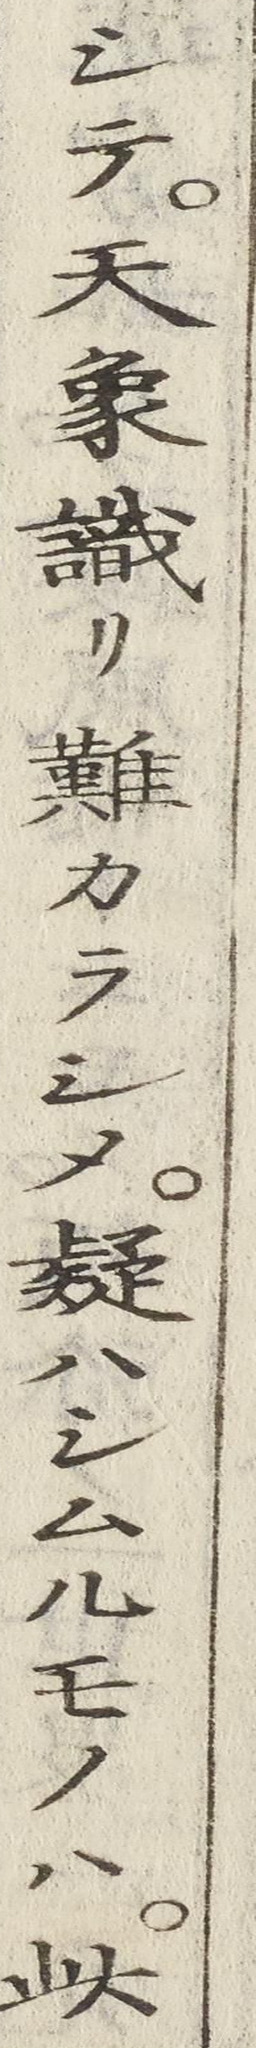シテ。天象識リ難カラシメ。疑ハシムルモノハ。此
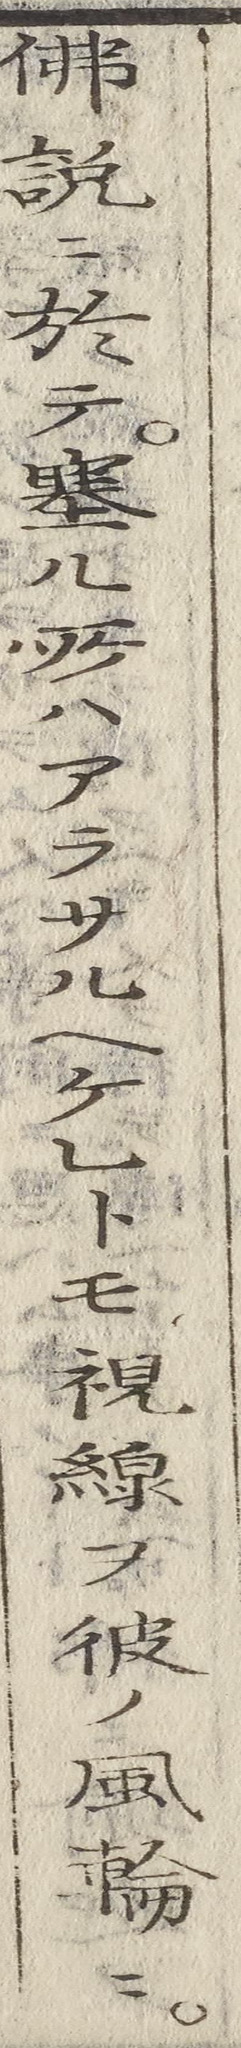仏説ニ於テ。塞ル所ハアラサルヘケレトモ視線ヲ彼ノ風輪ニ。
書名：護法新論　上
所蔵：東京大学地震研究所図書室 Earthquake Research Institute Library, The University of Tokyo, JAPAN
